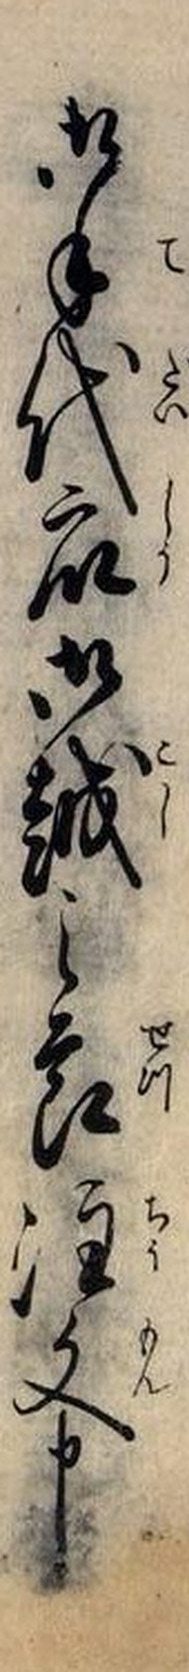御手代衆御越之節注文申
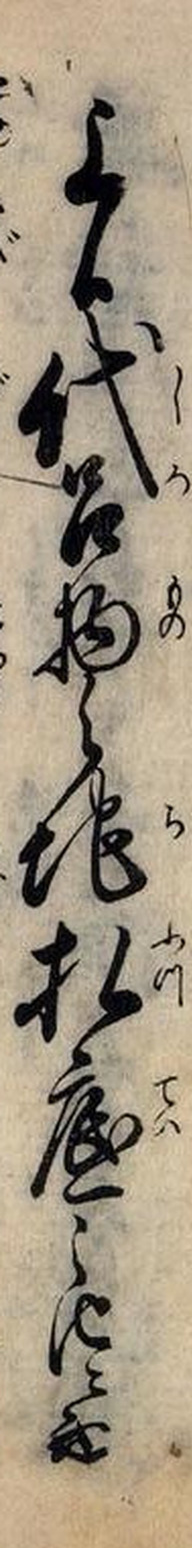上候代呂物之地払底之由に而
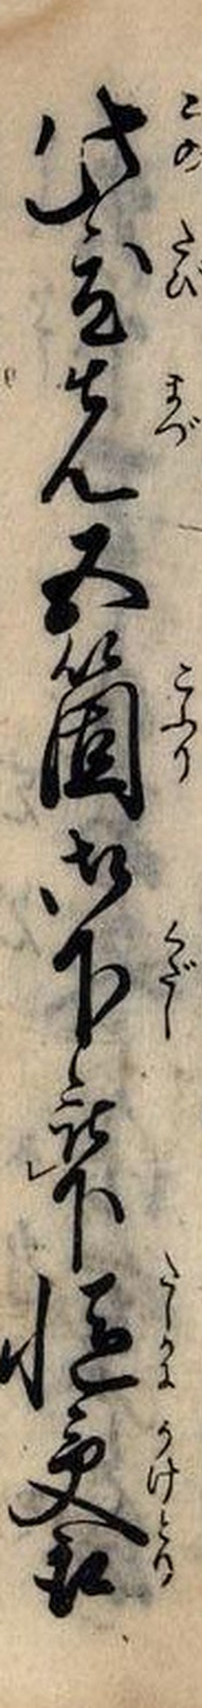此度先五箇御下被下慥受取
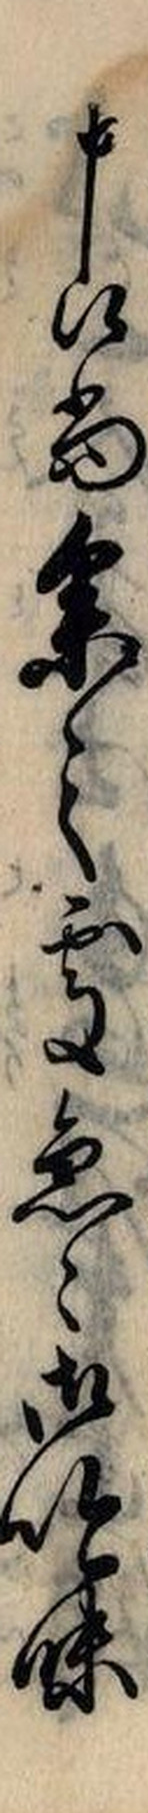申候尚余之處急々御吟味
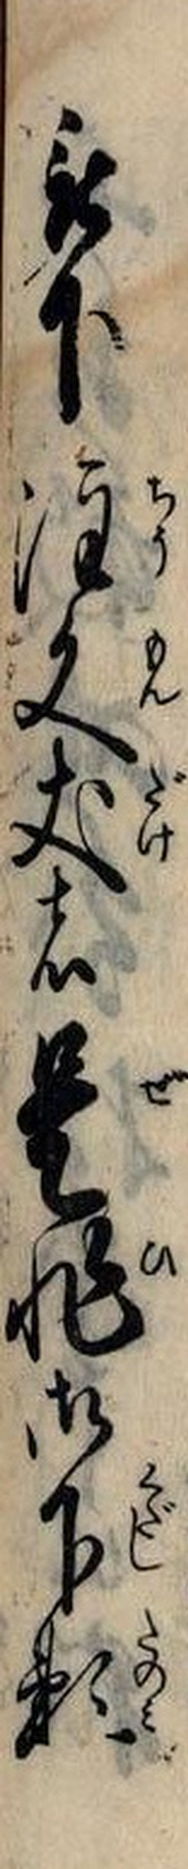被下注文丈者是非御下頼
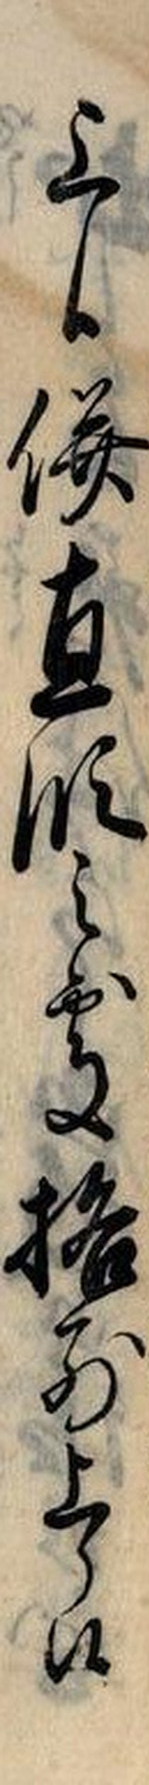上候併直段之處格別上り候
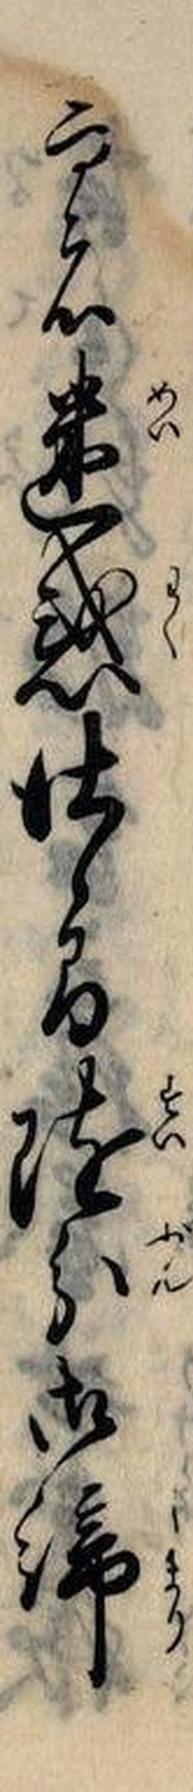而者迷惑仕候間随分御締
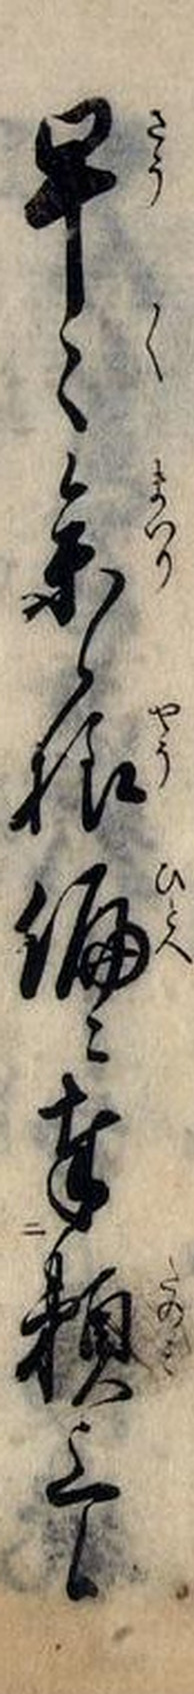早々参候様偏に奉頼上候

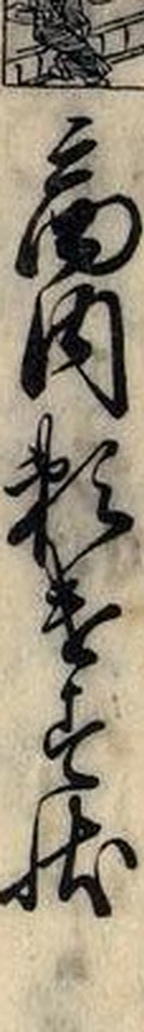商内頼遣す状
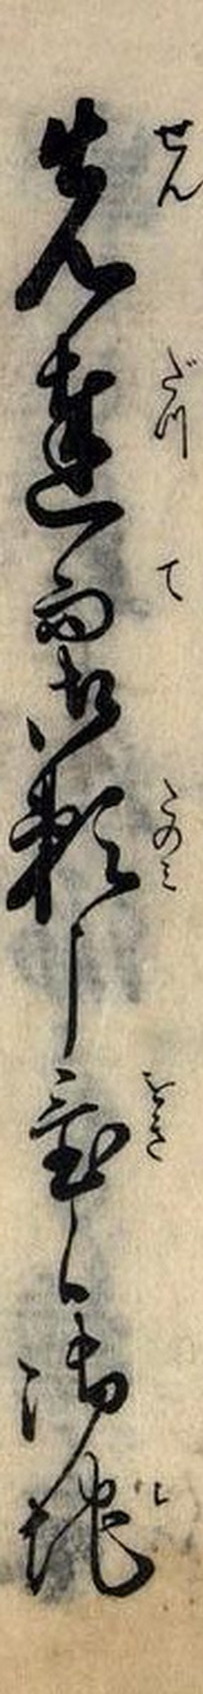先達而御頼申置候御地
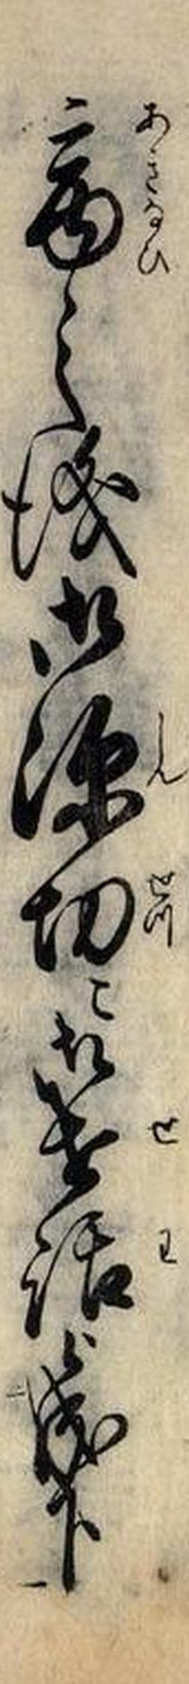商之儀御深切に御世話被成下
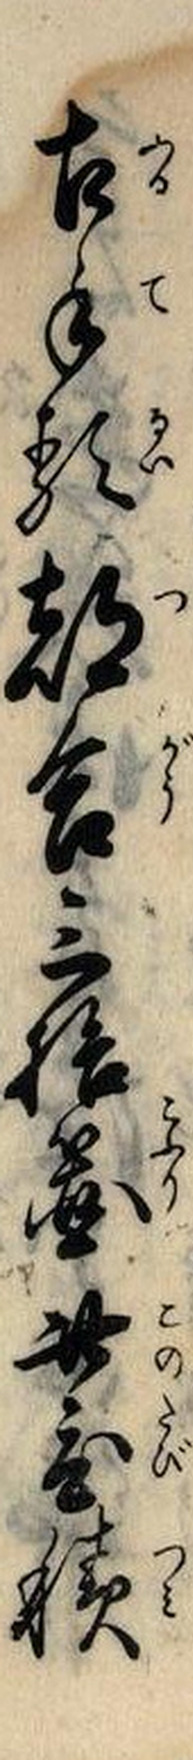古手類都合三拾箇此度積
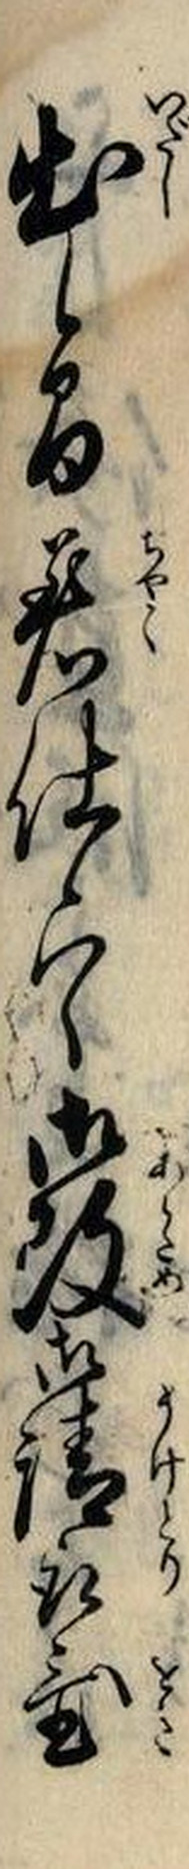出候間着仕候はゝ御改御請取置
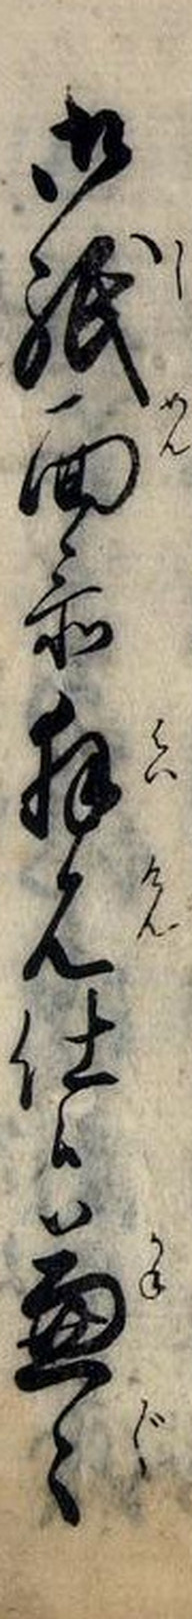御紙面忝拝見仕候兼々

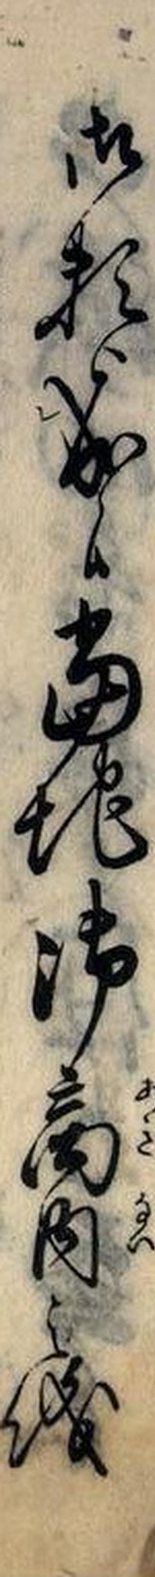御頼被成候當地御商内之儀
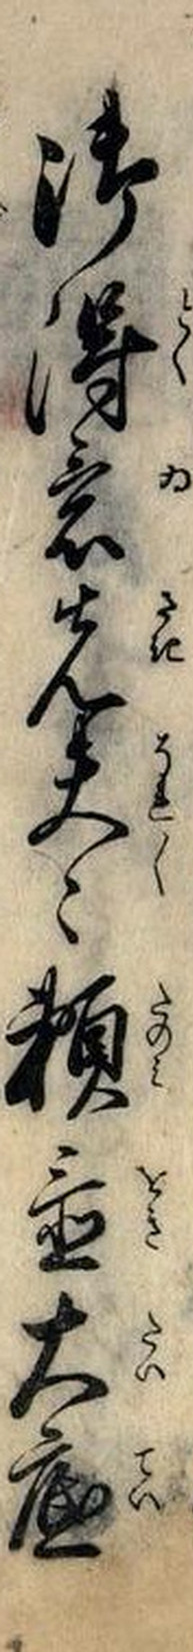御得意先夫々頼置大底
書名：大成用文章（往来物）
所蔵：福井県文書館 Fukui Prefectural Archives
